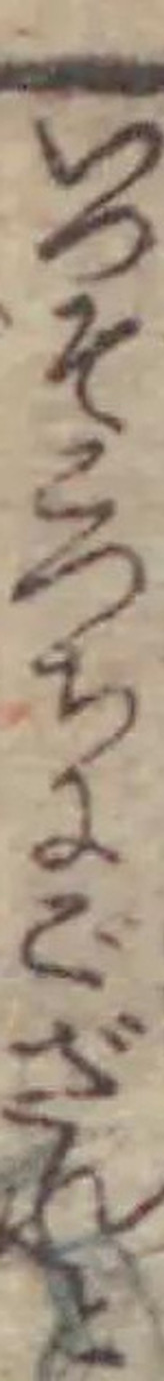いつそこつちにござれと
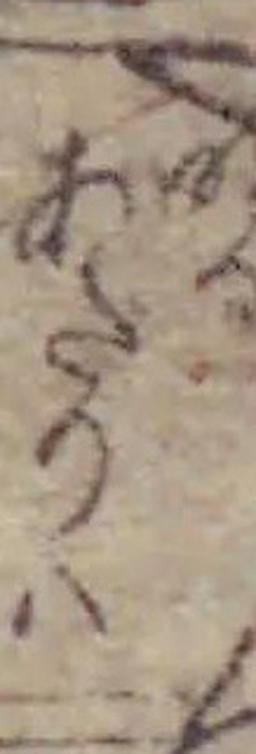あたりは
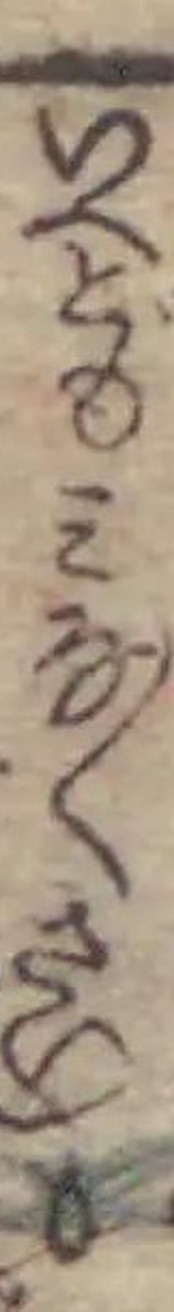いへどもみな〳〵さいしも
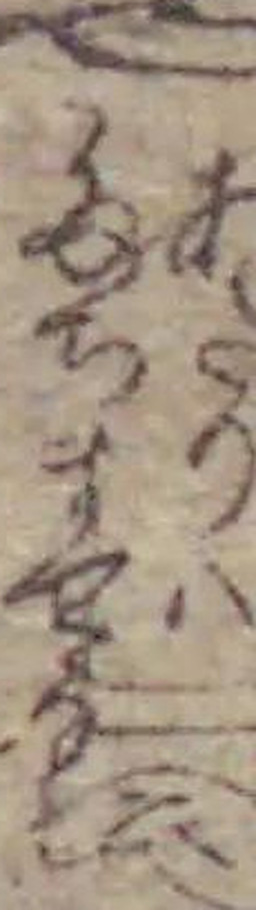たちませう
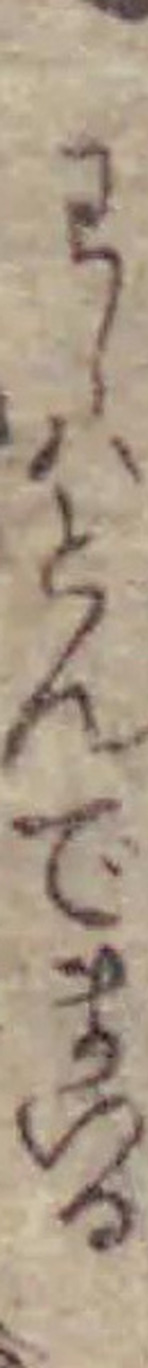わしはとんでまいる
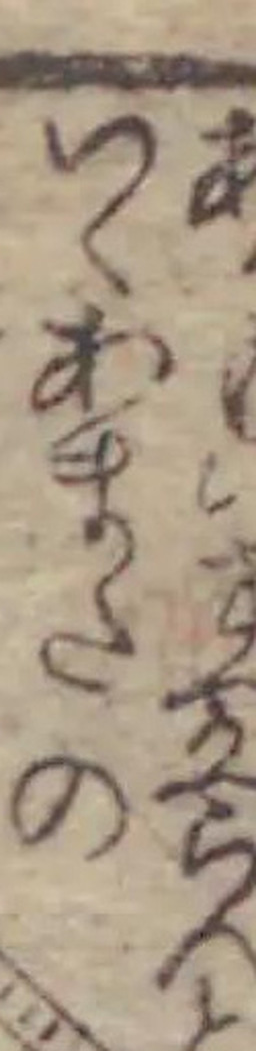いゝあまたの
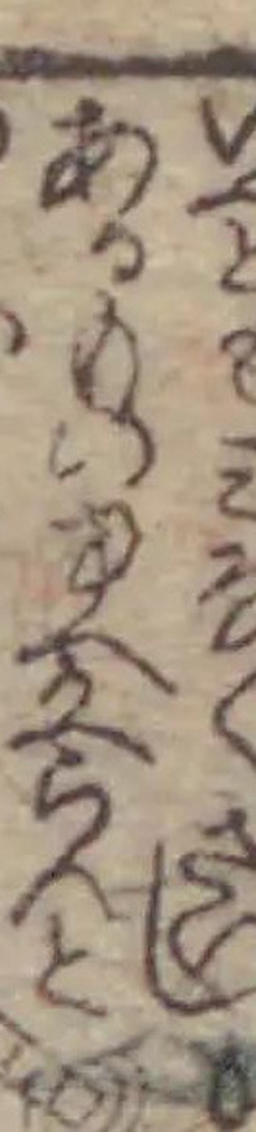あるものゆへかへらんと
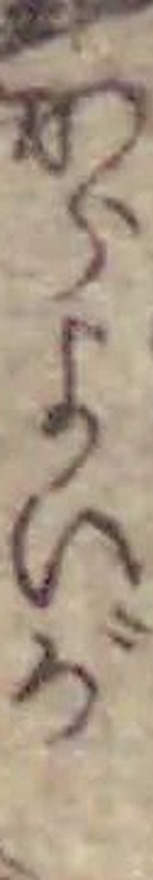からよいが
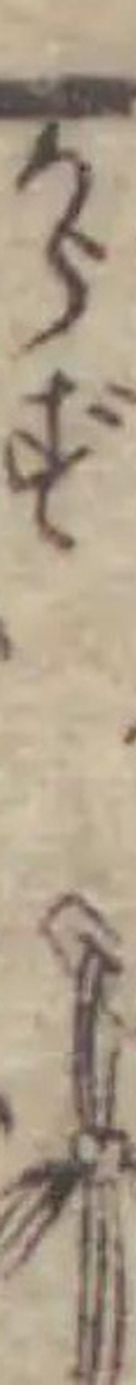からず
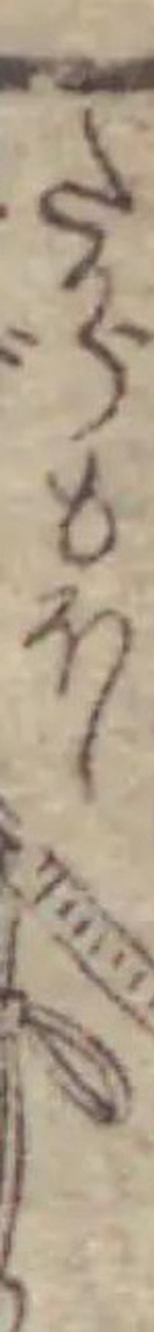たからもほし
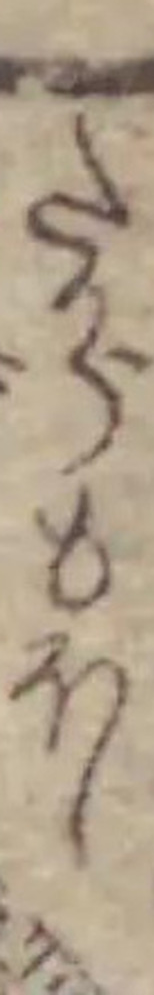たからもほし
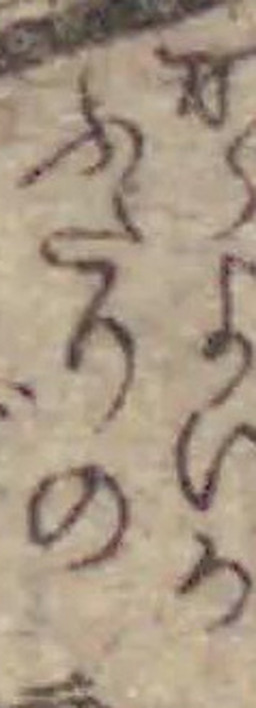ふたりの
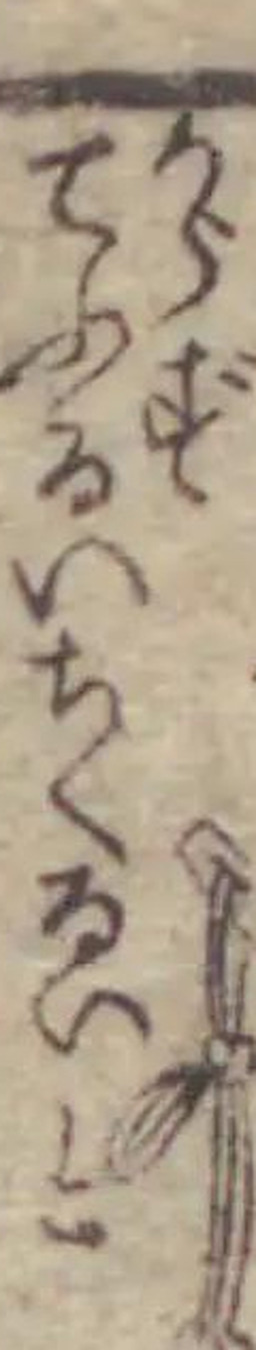てふるいちくるいと
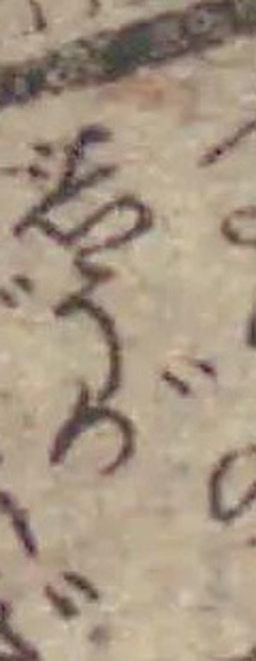しうが
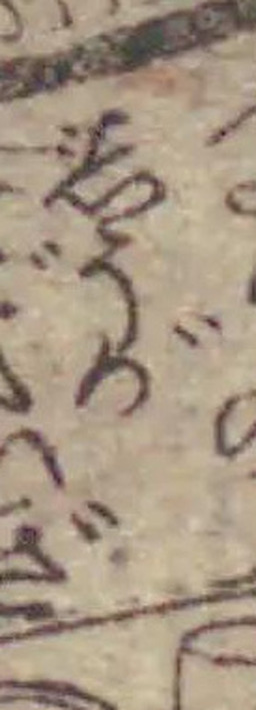しうが
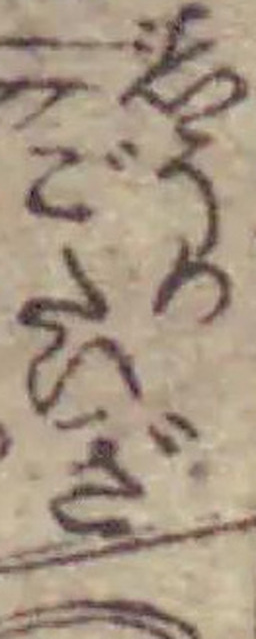ごたいぎ
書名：桃太郎元服姿 2巻
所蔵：国立国会図書館 National Diet Library, JAPAN
